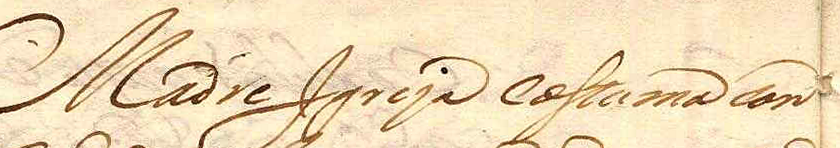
Madre Jgreja e assuma con
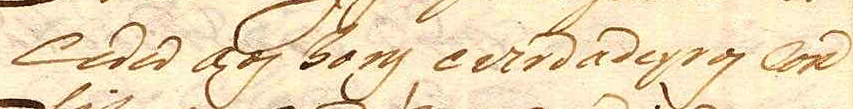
ceder aos bons e verdadeyros con
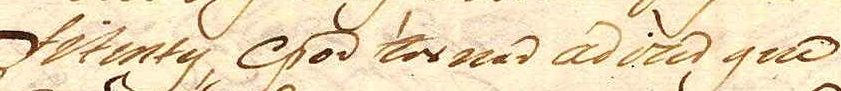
fitentes, e por tornar a dizer que
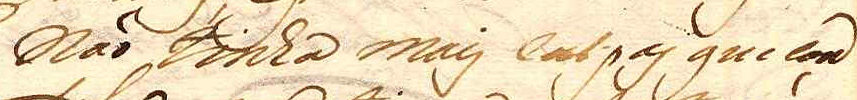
naõ tinha mais culpas que con
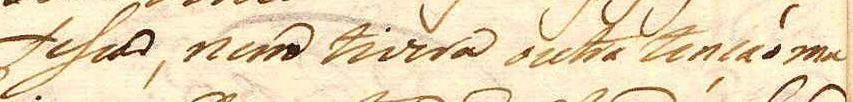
fessar, nem tivera outra tençaõ ma
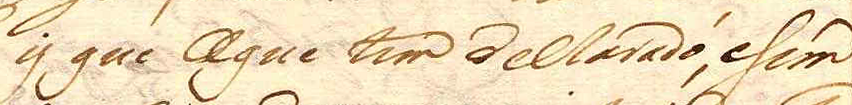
es que o que tem declarado, e sem
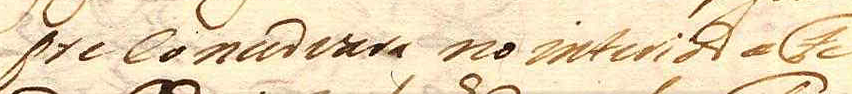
pre concervara no interior a Fe
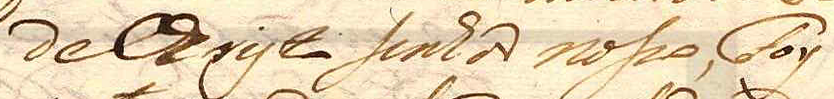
de Cristo senhor nosso, Foy
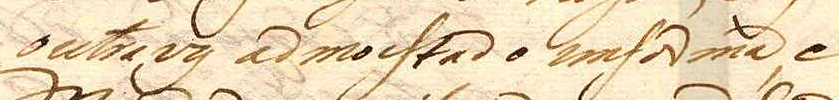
outra ves admoestado em forma, e
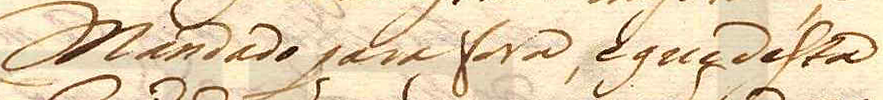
Mandado para fora, e que desta
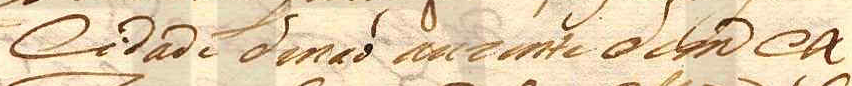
Cidade se naõ auzente sem ex
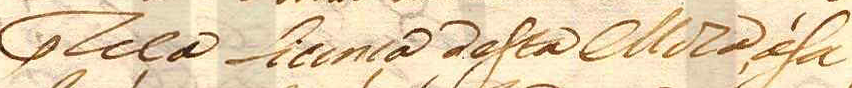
pReça Licença desta Meza, e sa
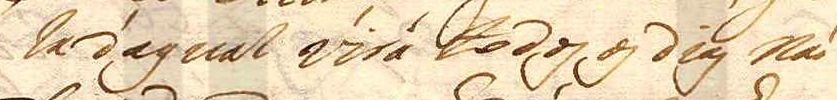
la da qual virá todos os dias naõ
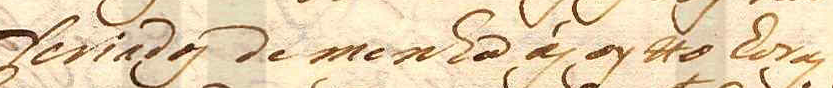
feriados de menhã ás oytto horas,
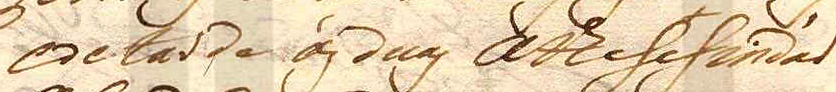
e de tarde ás duas athe se findar
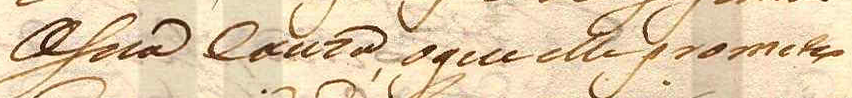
a sua cauza, o que elle prometeo
